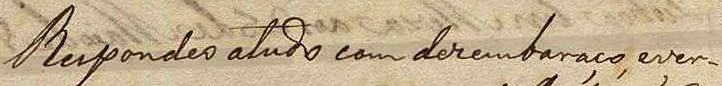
Respondeo a tudo com dezembaraço e ver
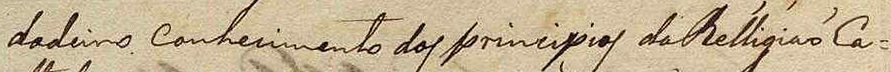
dadeiro conhecimento dos principios da Relligiaõ Ca
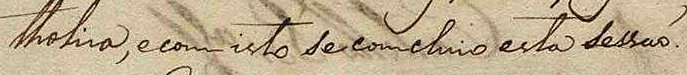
tholica, e com isto se comcluio esta sessaõ.
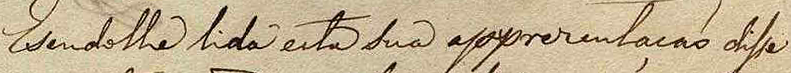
E sendolhe lida esta sua apprezentaçaõ disse
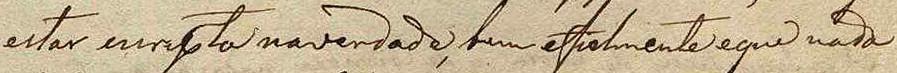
estar escripta na verdade bem e fielmente, e que nada
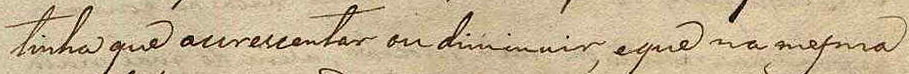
tinha que accrescentar ou diminuir, e que na mesma
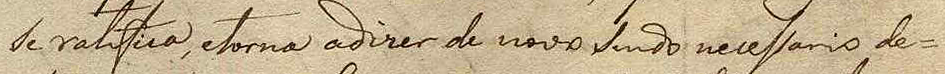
se ratifica, e torna a dizer de novo, sendo necessario de
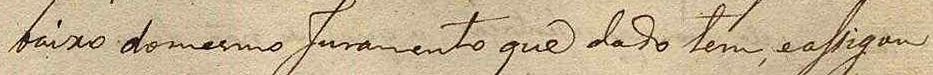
baixo do mesmo Juramento que dado tem, e assigou
